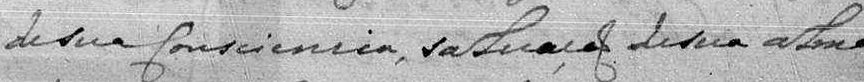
de sua Consciencia, saluaçaõ de sua alma,
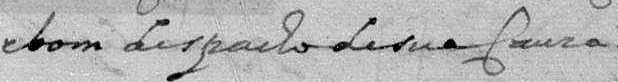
e bom despacho de sua Cauza.
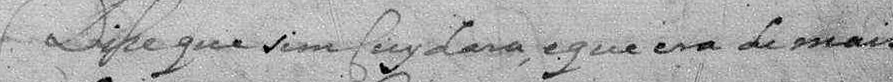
Disse que sim Cuydara, e que era de mais
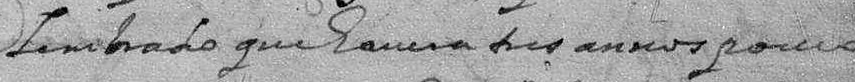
Lembrado que hauera tres annos pouco
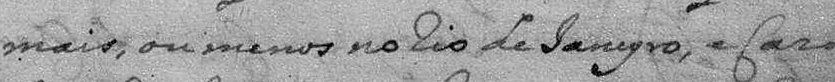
mais, ou menos no Rio de Ianeiro, e Caza
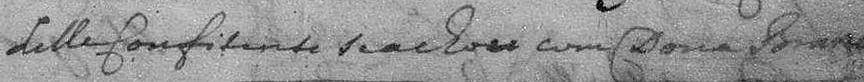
delle Confitente se achou com Dona Branc
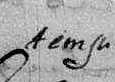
tempo
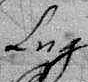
Lug
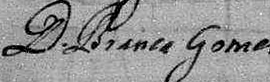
D. Branca Gomes
